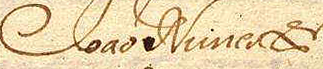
Ioaõ Nunes xer
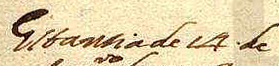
Estancia de 14. de
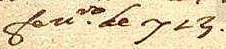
feu.ro de 713.
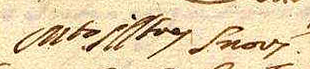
M.to Ill.tres Snors̄.
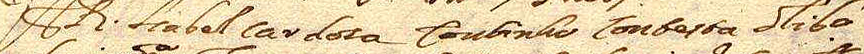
A R. Izabel Cardoza Coutinho contesta o lib.o
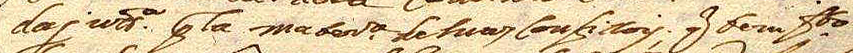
da just.a p̄.la mater.a de suas confisçois, q̄ tem f.to
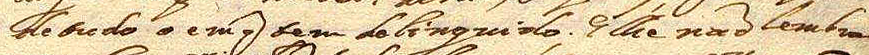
de tudo o em q̄ tem delinguido, E lhe naõ lembra
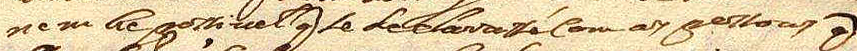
nem he possiuel q̄ se declarasse com as pessoas q̄
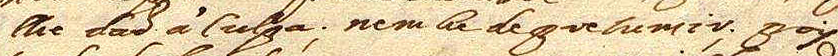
lhe daõ á Culpa; nem he de presumir; pois
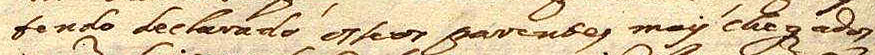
tendo declarado os seos parentes mais chegados
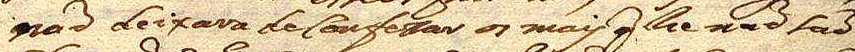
naõ deixava de Confessar os mais q̄ lhe naõ saõ
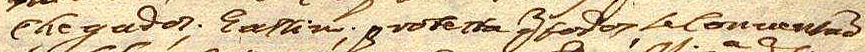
chegados. E assim; protesta q̄ todos se conuensaõ
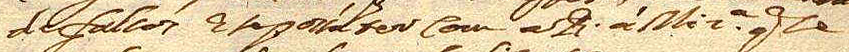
de falsos E se possa ter com a R. a Miz.a q̄ se
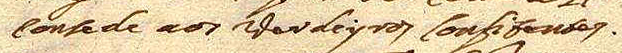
consede aos verdeyros Confitentes.
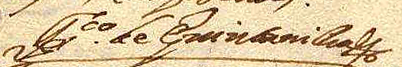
Fr.co de Quintanilha
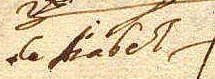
de Izabel
